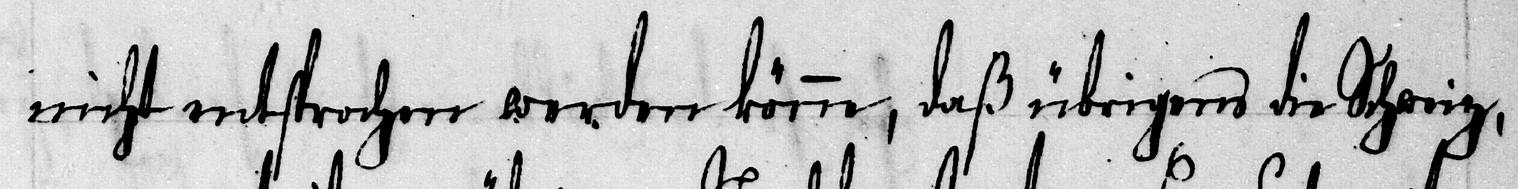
nicht entsprochen werden könne, daß übrigens die Schweiz,
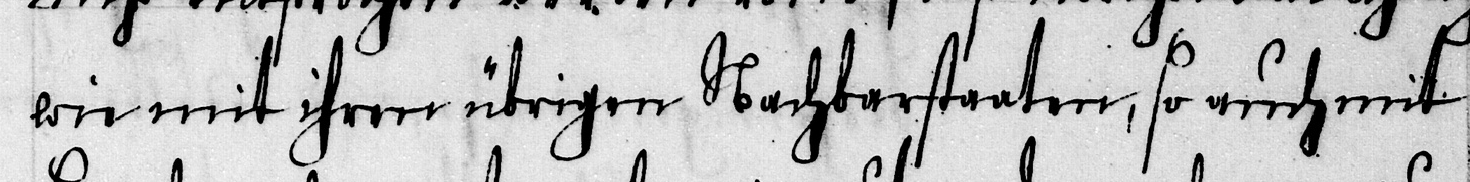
wie mit ihren übrigen Nachbarstaaten, so auch mit
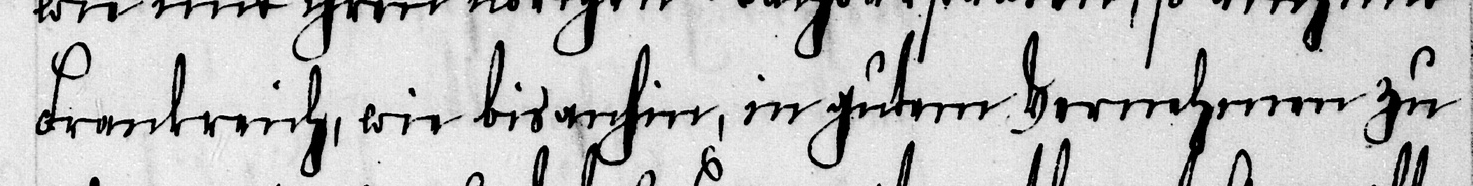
Frankreich, wie bis anhin, in gutem Vernehmen zu
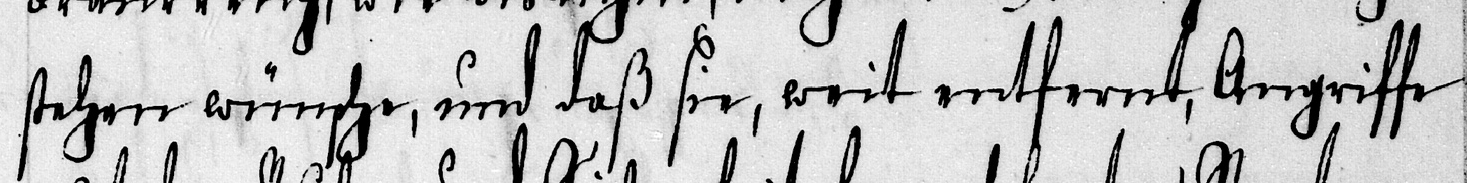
stehen wünsche, und daß sie, weit entfernt, Angriffe
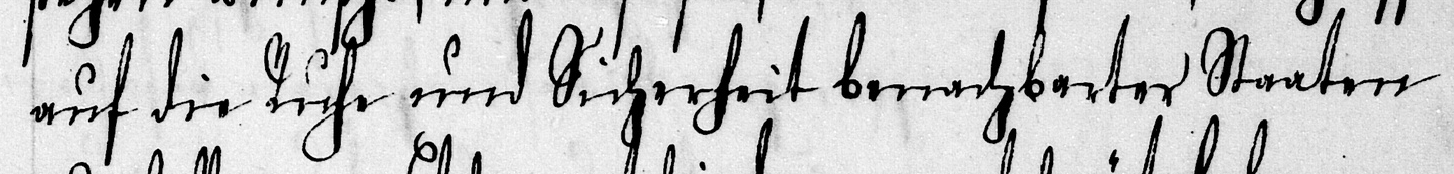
auf die Ruhe und Sicherheit benachbarter Staaten
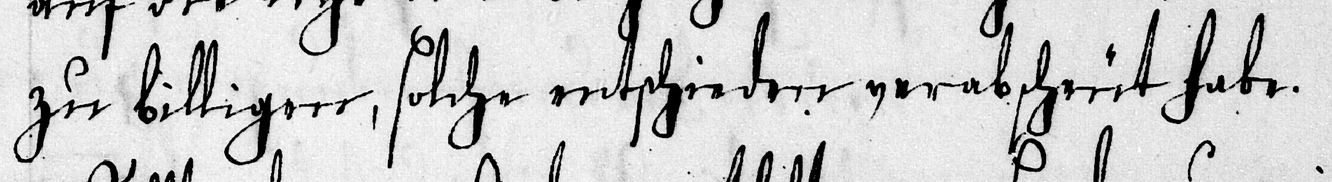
zu billigen, solche entschieden verabscheut habe.
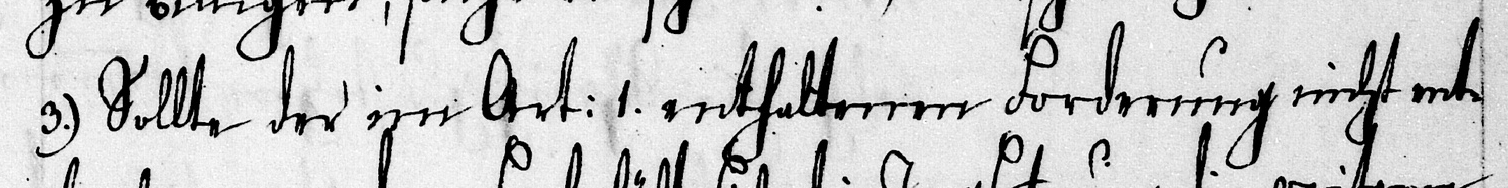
3.) Sollte der im Art: 1. enthaltenen Forderung nicht ent¬
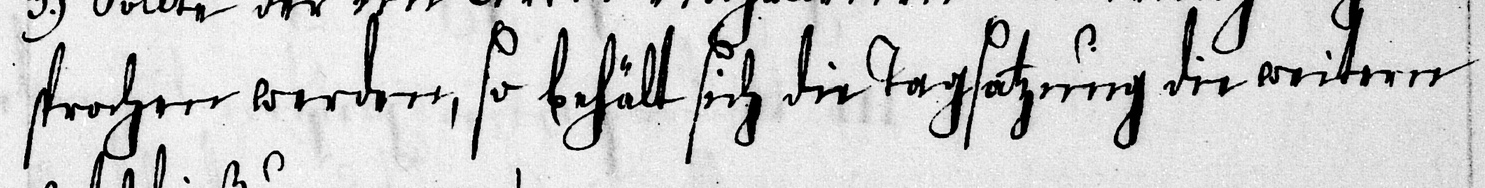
sprochen werden, so behält sich die Tagsatzung die weitern
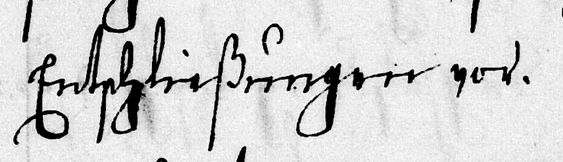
Entschließungen vor.
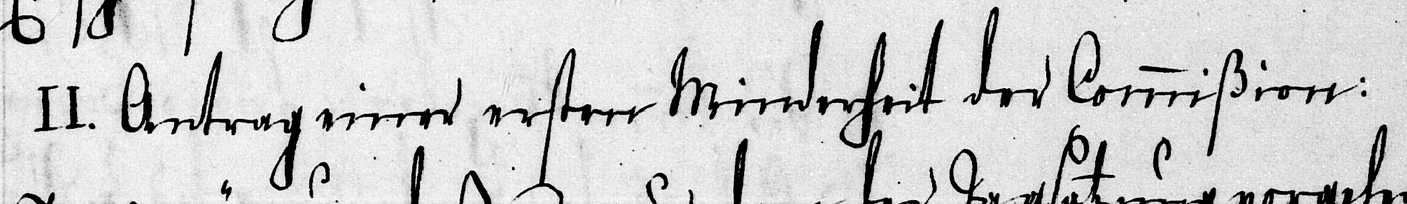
II. Antrag einer ersten Minderheit der Commißion:
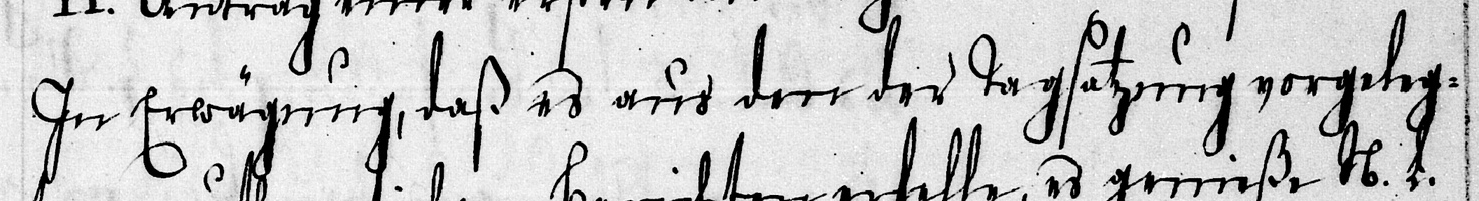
In Erwägung, daß es aus den der Tagsatzung vorgeleg¬
